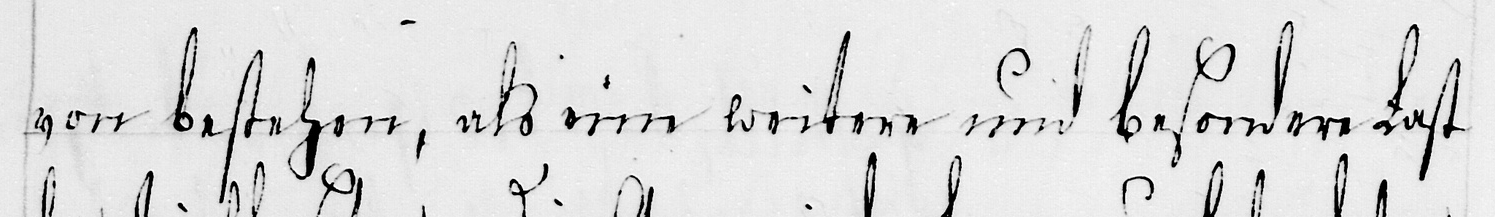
von bestehen, als eine weitere und besondere Last
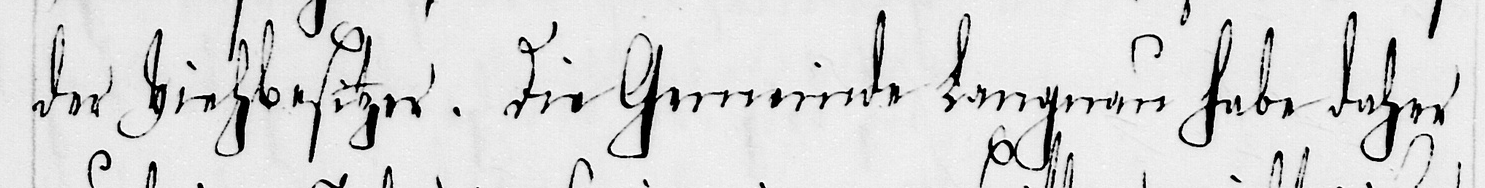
der Viehbesitzer. Die Gemeinde Langnau habe daher
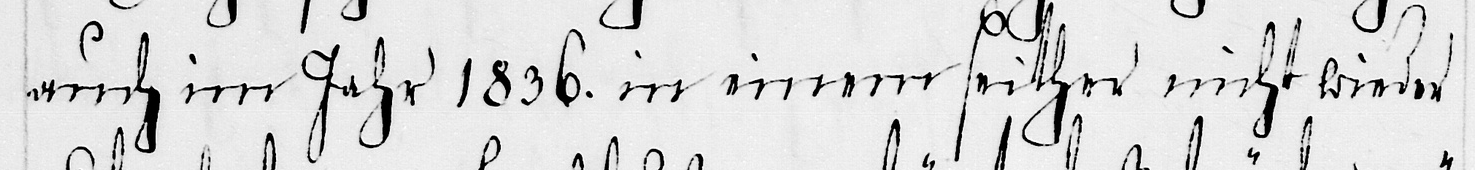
auch im Jahr 1836. in einem seither nicht wieder
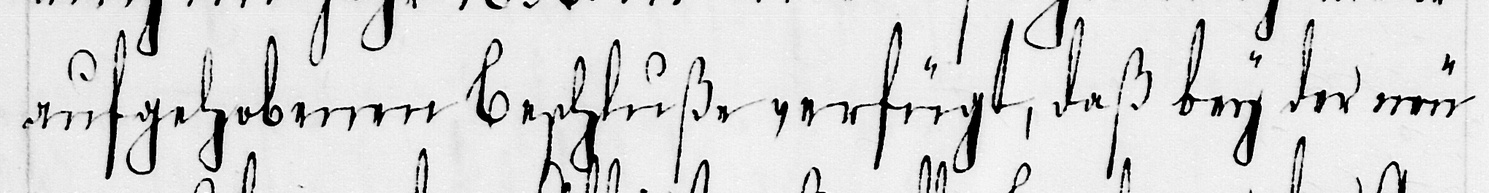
aufgehobenen Beschluße verfügt, daß bey der neu
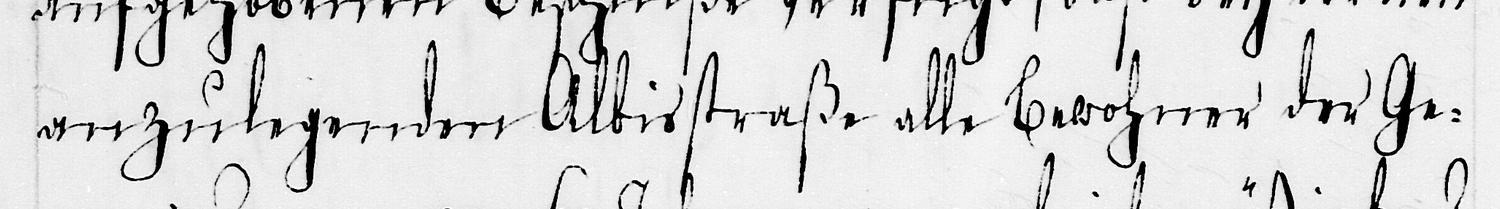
anzulegenden Albisstraße alle Bewohner der Ge¬
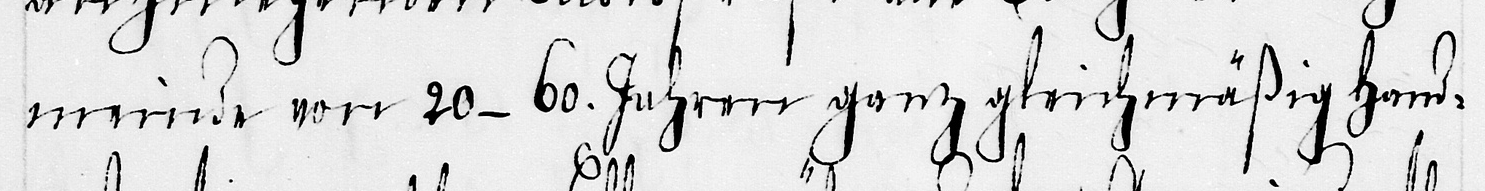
meinde von 20−60. Jahren ganz gleichmäßig Hand¬
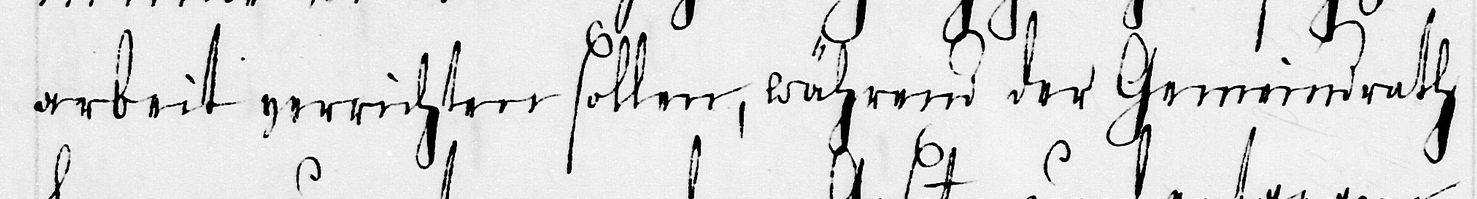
arbeit verrichten sollen, während der Gemeindrath
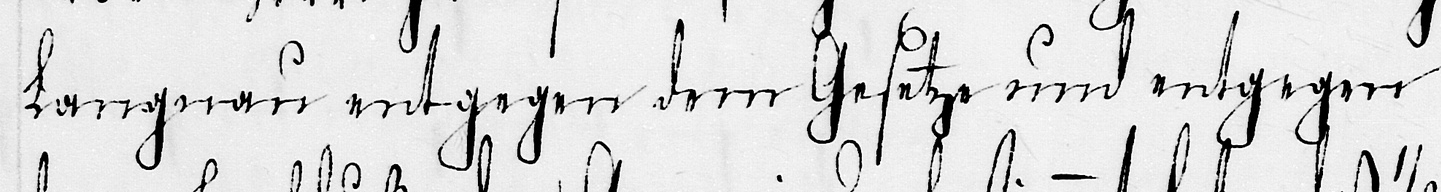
Langnau entgegen dem Gesetze und entgegen
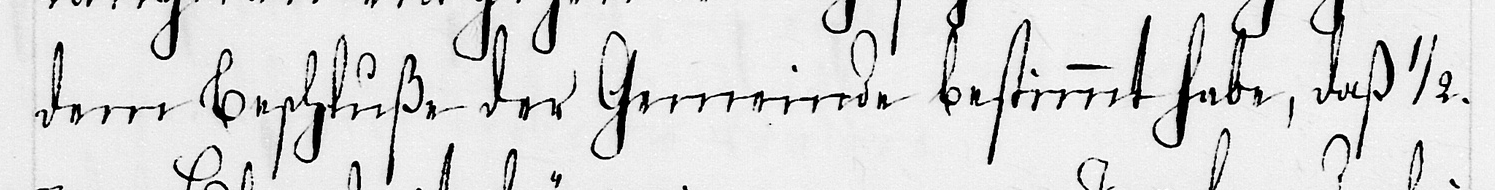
dem Beschluße der Gemeinde bestimmt habe, daß 1/2.
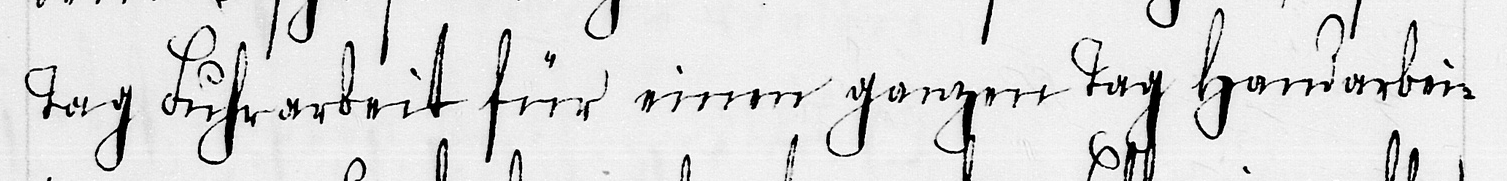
Tag Fuhrarbeit für einen ganzen Tag Handarbei¬
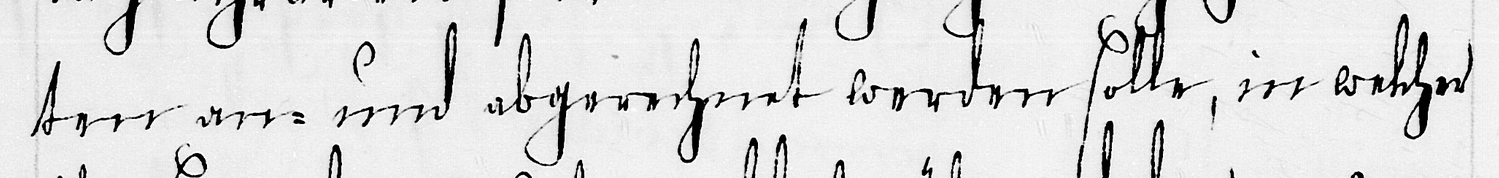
ten an- und abgerechnet werden solle, in welcher
